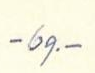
69
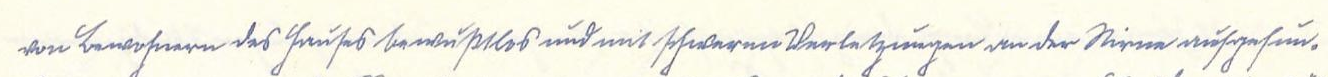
von Bewohnern des Hauses bewusstlos und mit schweren Verletzungen an der Stirn aufgefun-
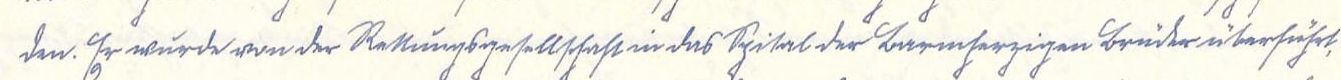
den. Er wurde von der Rettungsgesellschaft in das Spital der Barmherzigen Brüder überführt,
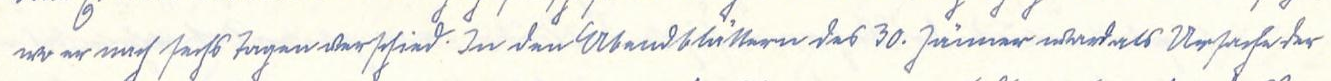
wo er nach sechs Tagen verschied. In den Abendblättern des 30. Jänner war als Ursache der
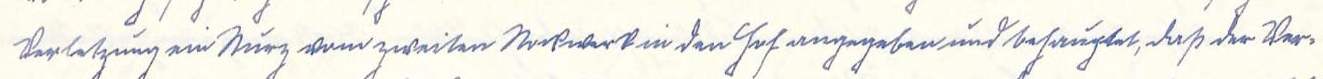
Verletzung ein Sturz vom zweiten Stockwerk in den Hof angegeben und behauptet, dass der Ver-
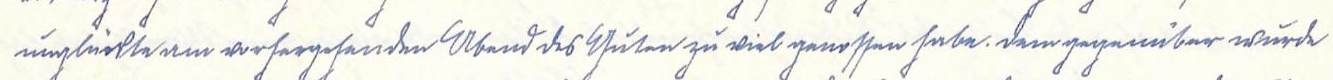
unglückte am vorhergehenden Abend des Guten zu viel genossen habe. Demgegenüber wurde
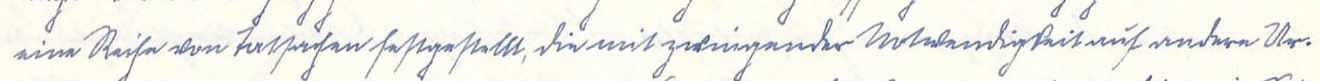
eine Reihe von Tatsachen festgestellt, die mit zwingender Notwendigkeit auf andere Ur-
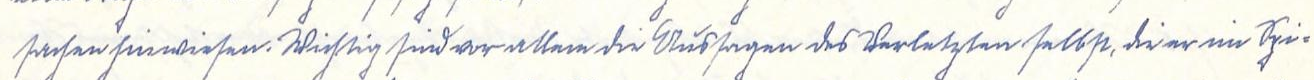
sachen hinwiesen. Wichtig sind vor allem die Aussagen des Verletzten selbst, die er im Spi-
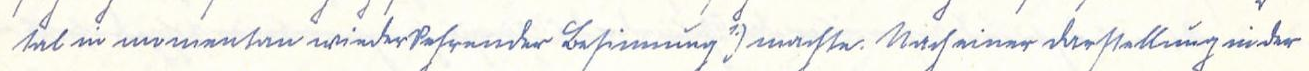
tal in momentan wiederkehrender Besinnung 1) machte. Nach einer Darstellung in der
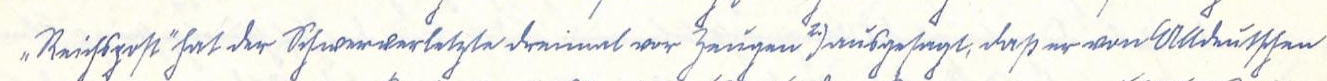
„Reichspost“ hatte der Schwerverletzte dreimal vor Zeugen ausgesagt, dass er von Allendeutschen
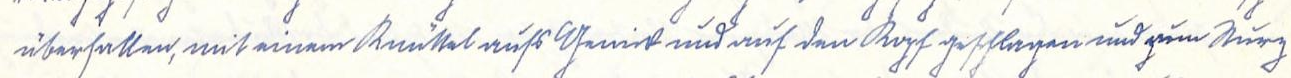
überfallen, mit einem Knüttel aufs Genick und auf den Kopf geschlagen und zum Sturz
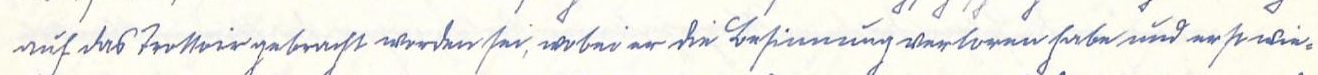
über das Trottoir gebracht worden sei, wobei er die Besinnung verloren habe und erst wie-
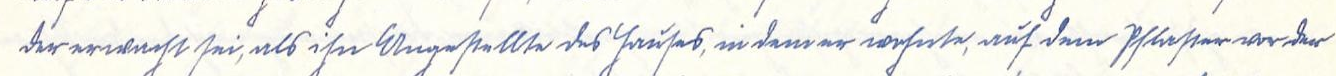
der erwacht sei, als ihn Angestellte des Hauses, in dem er wohnte, auf dem Pflaster vor der
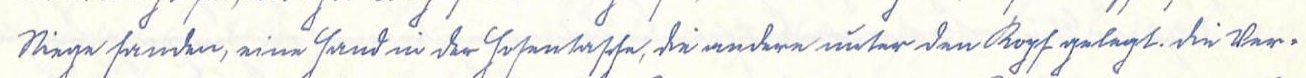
Stiege fanden, eine Hand in der Hosentasche die andere unter den Kopf gelegt. Die Ver-
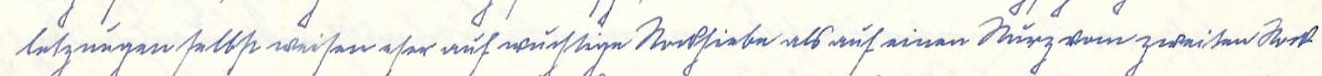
letzungen selbst weisen eher auf wuchtige Stockhiebe als auf einen Sturz vom zweiten Stock
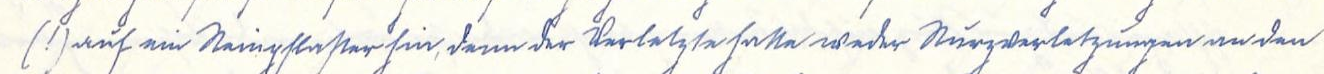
(!) auf ein Steinpflaster hin, denn der Verletzte hatte weder Sturzverletzungen an den
